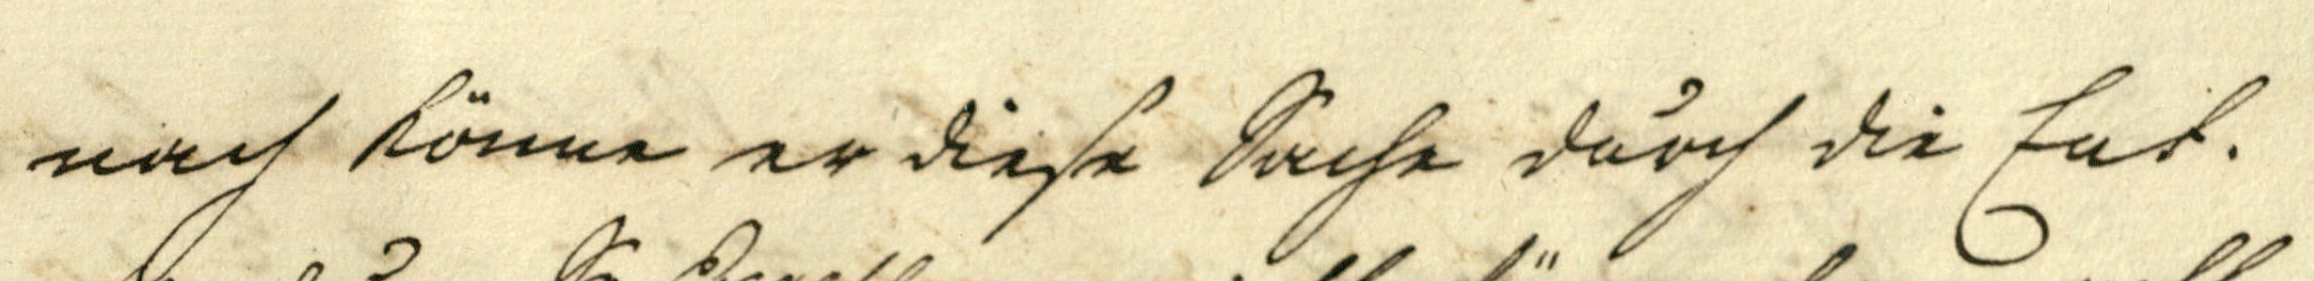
nach könne er diese Sache durch die Ent¬
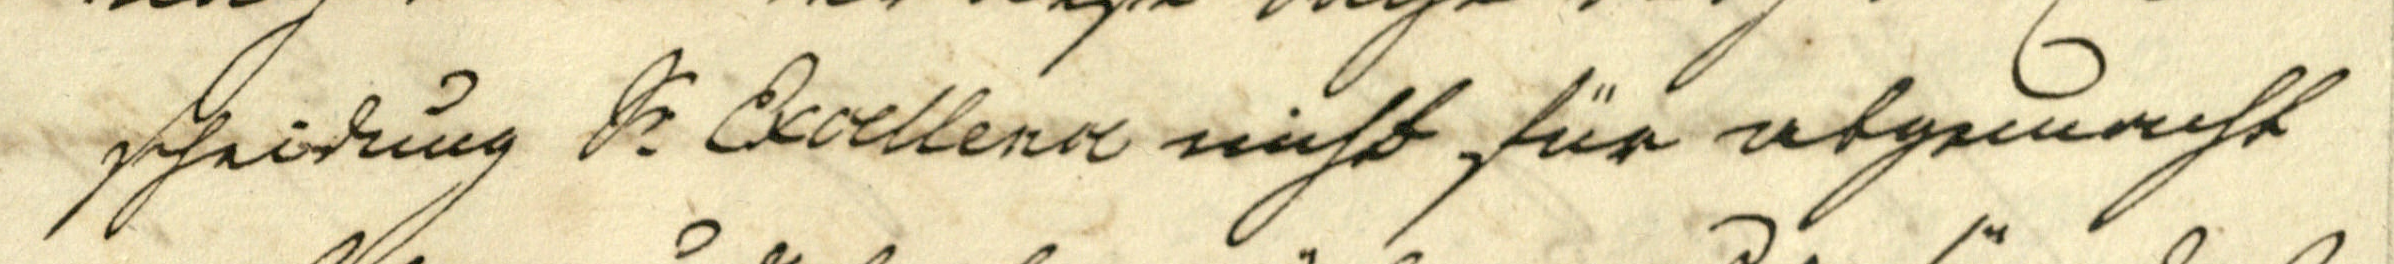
scheidung Sr Excellence nicht für abgemacht
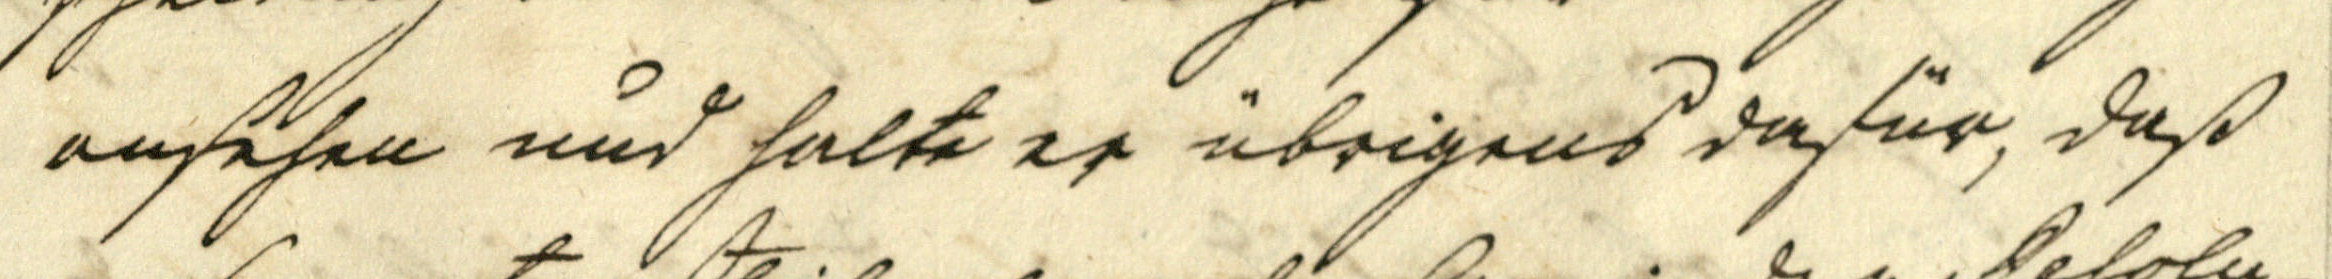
ansehen und halte er übrigens dafür, daß
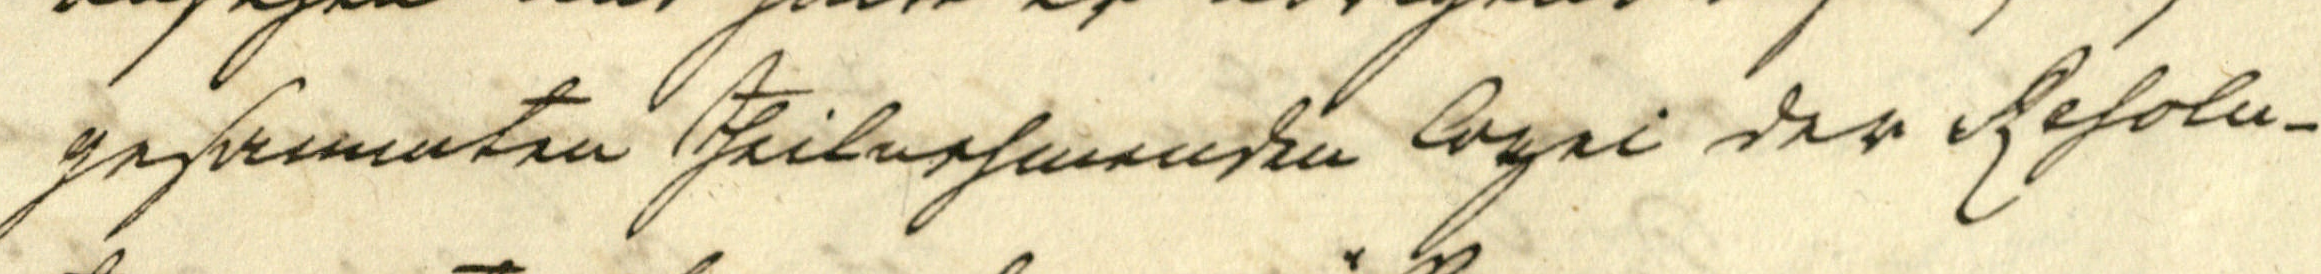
gesammten Theilnehmenden Copei der Resolu¬
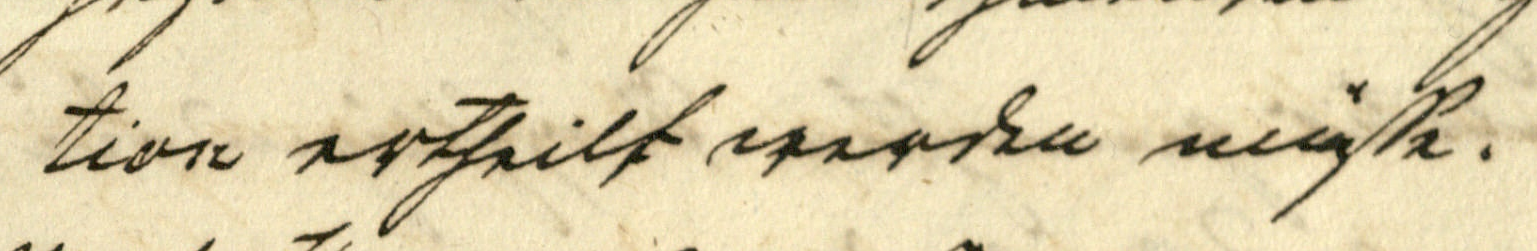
tion ertheilt werden müsse.
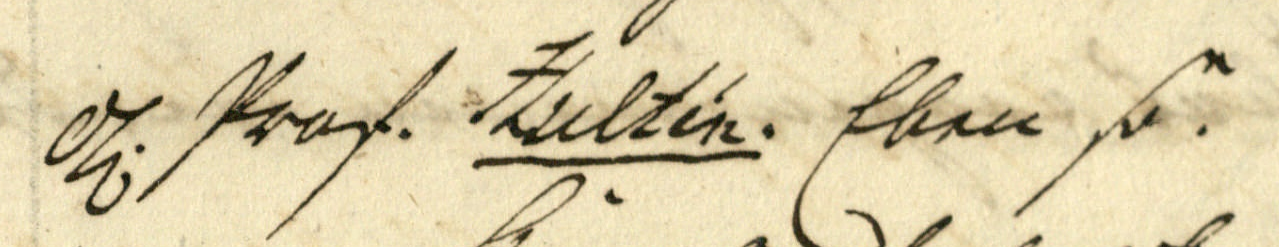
dh. Prof. Hultén. Eben so.
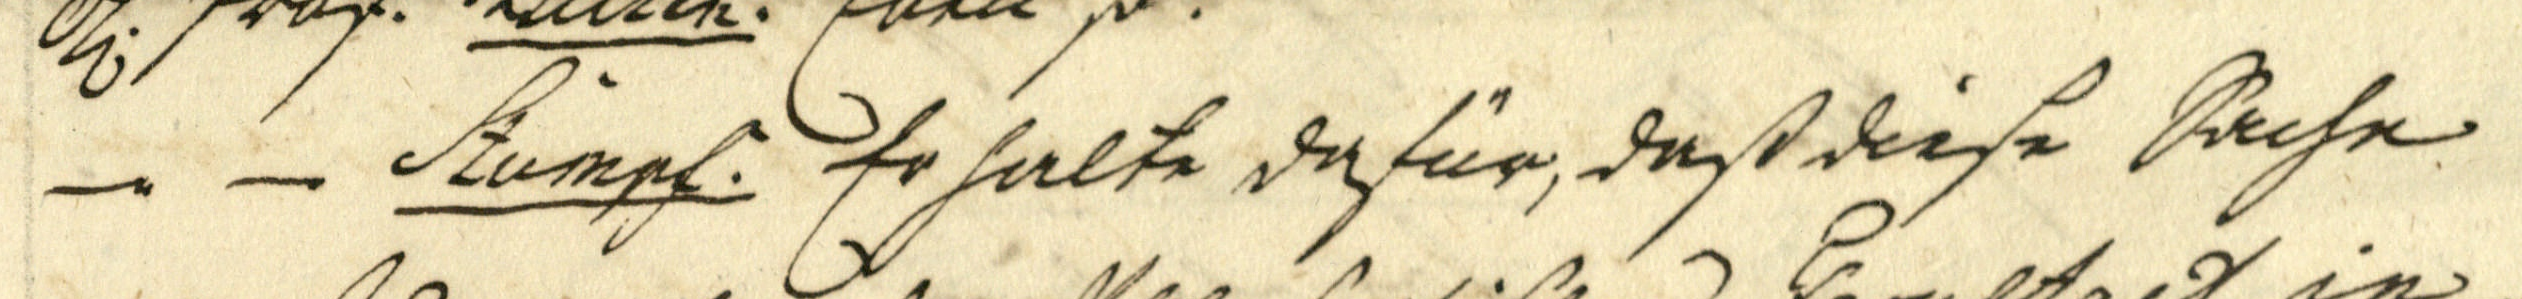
Stumpf. Er halte dafür, daß diese Sache
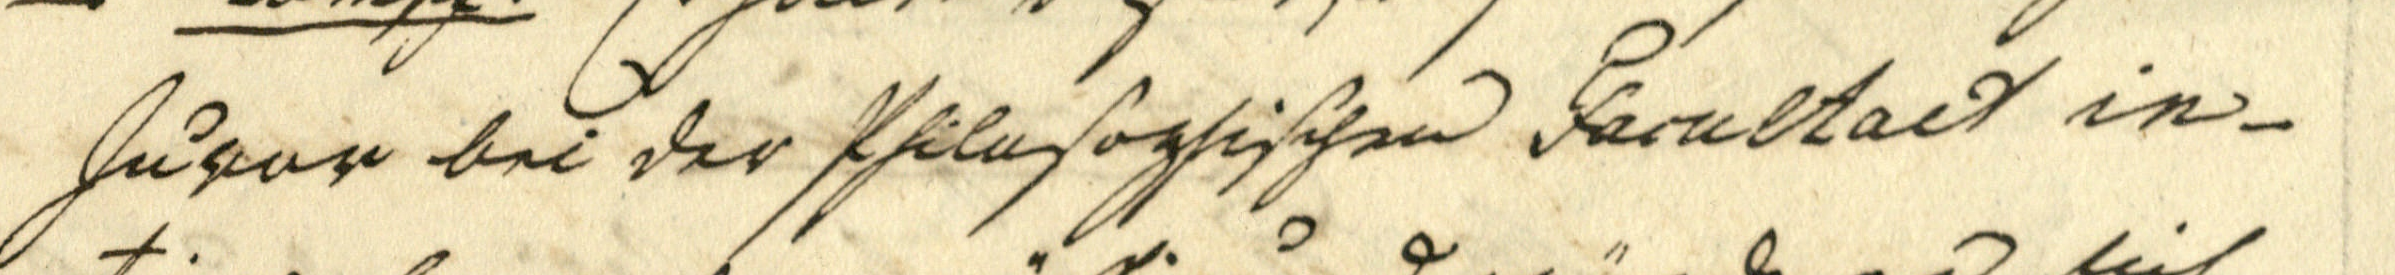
zuvor bei der Philosophischen Facultaet in¬
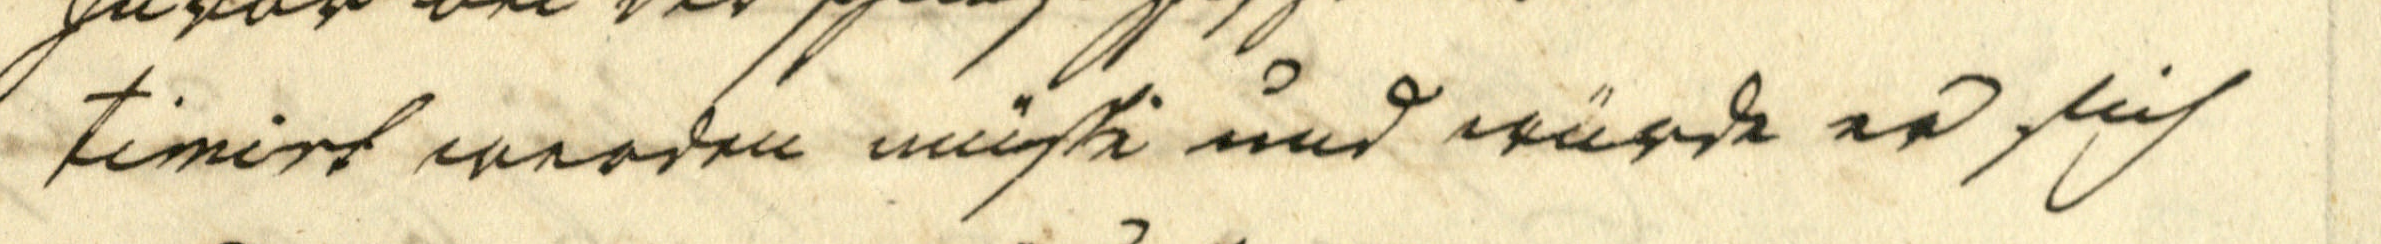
timirt werden müsse und würde er sich
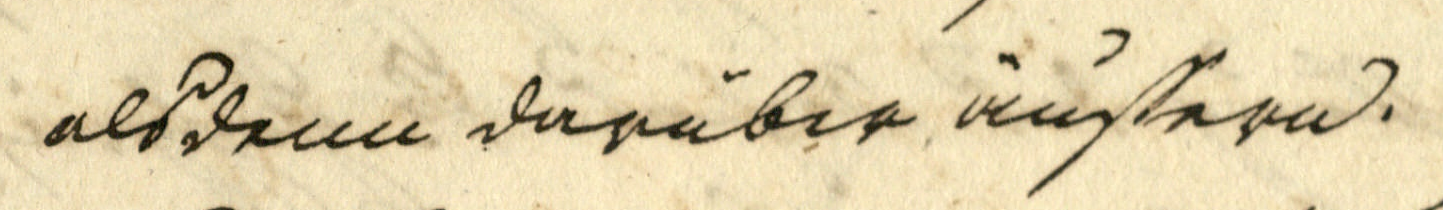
als denn darüber äussern.
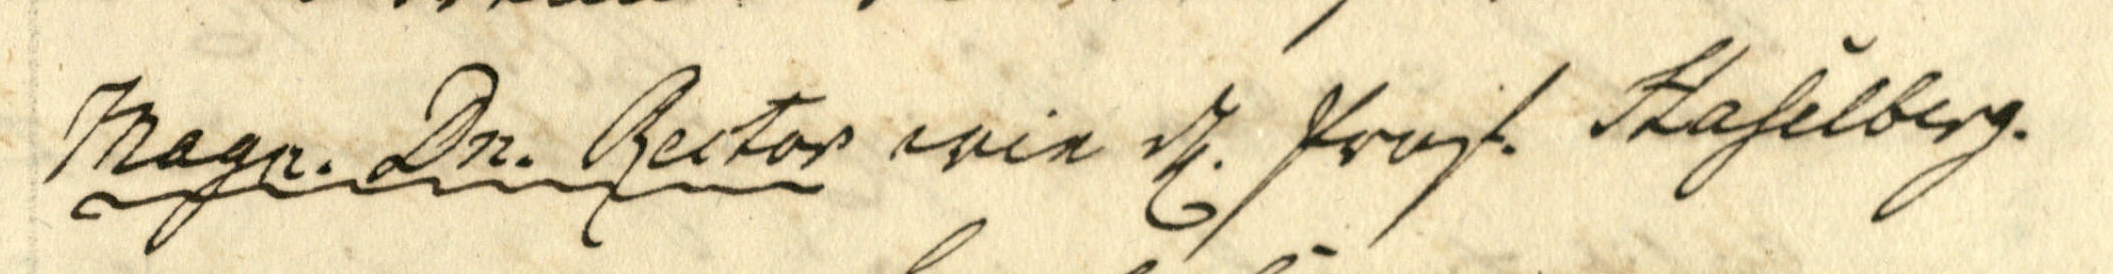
Magn. Da. Rector wie dh. Prof. Haselberg.
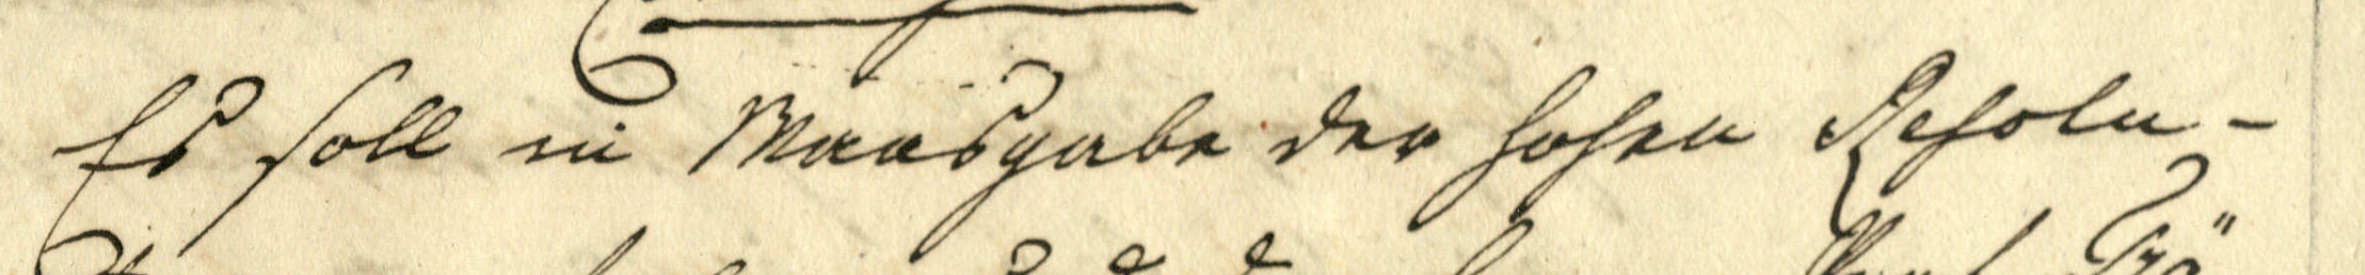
Es soll in Maasgabe der hohen Resolu¬
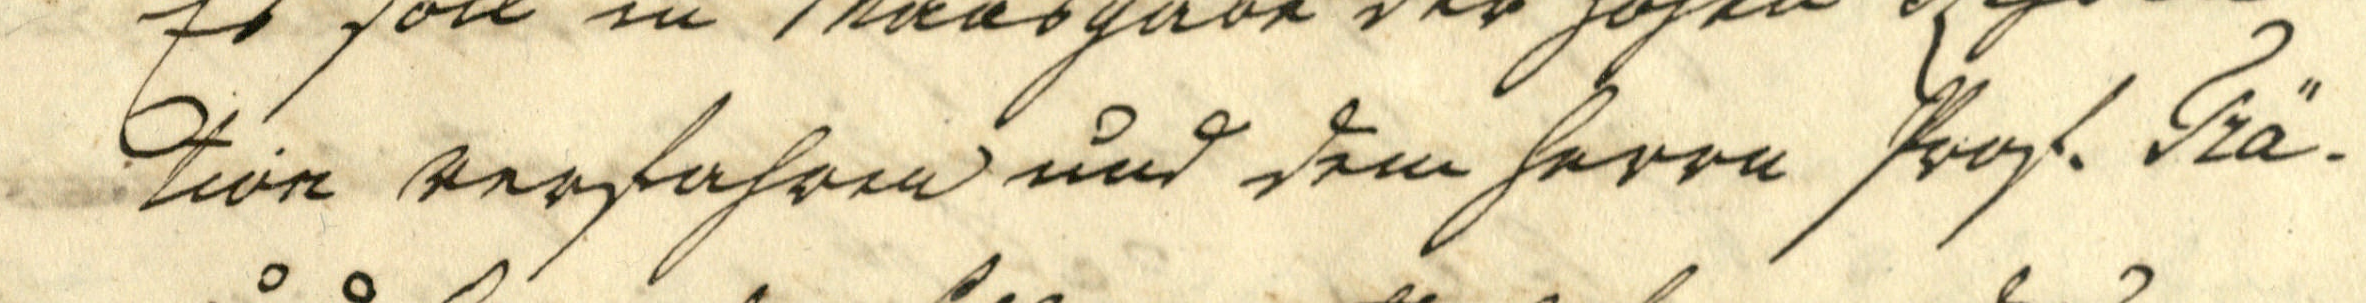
tion verfahren und dem Herrn Prof. Trä¬
